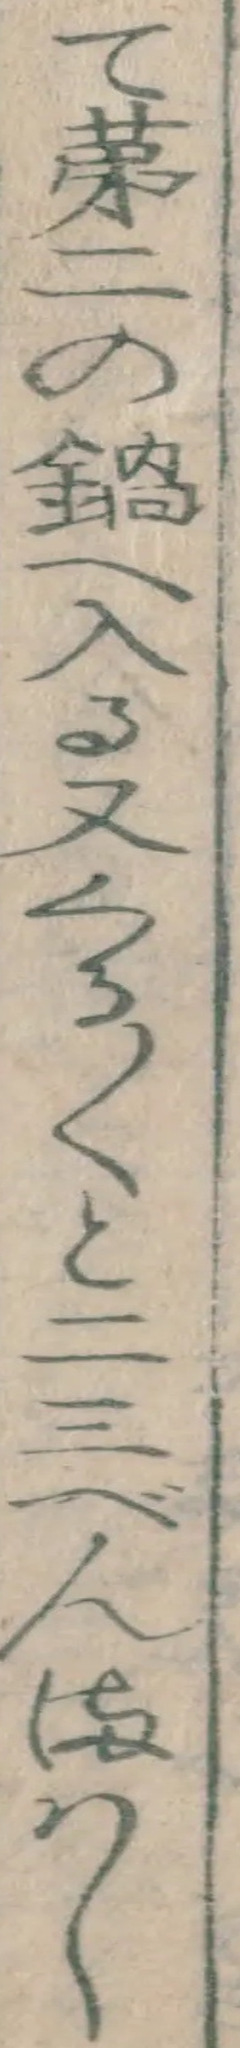て第二の鍋へ入る又くる〳〵と二三べんまはし
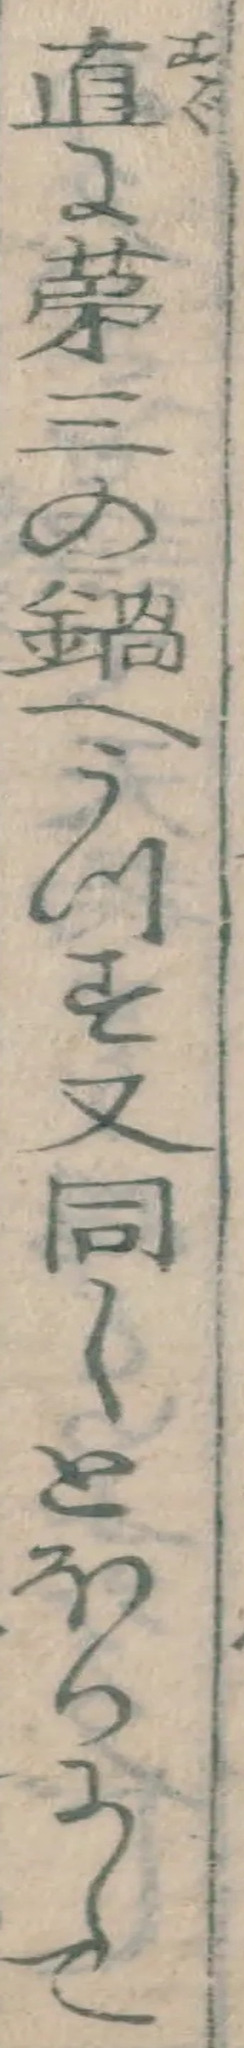直に第三の鍋へうつす又同しとほりにして
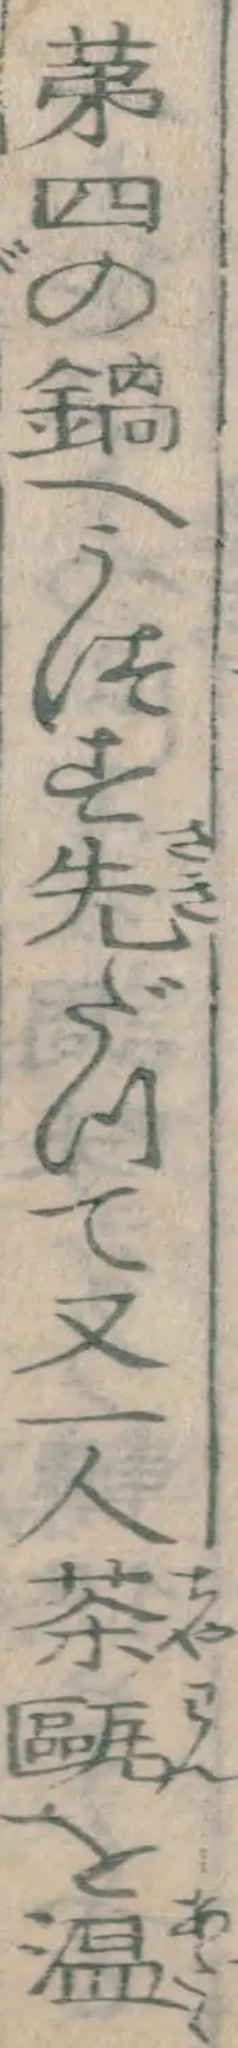第四の鍋へうつす先だつて又一人茶甌を温
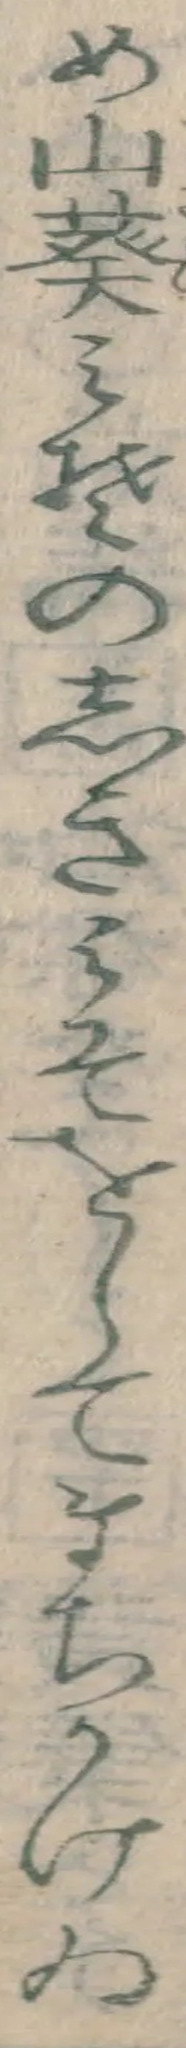め山葵みそのしきみそをしてまちかけゐ
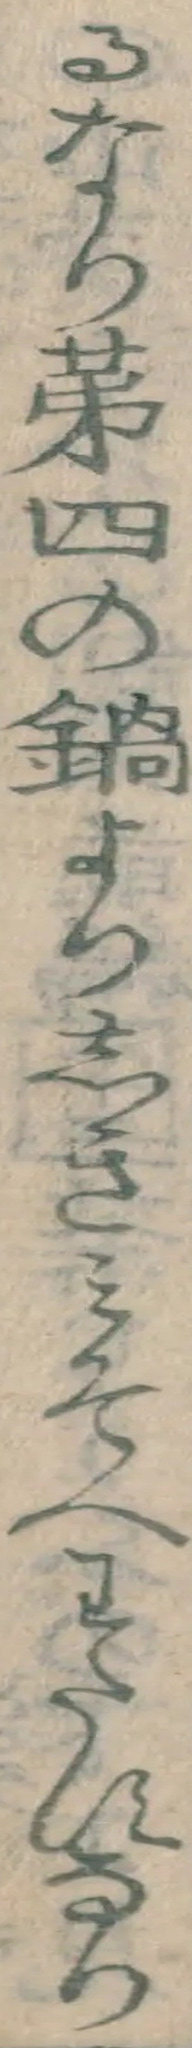るなり第四の鍋よりしきみそへわたすなり

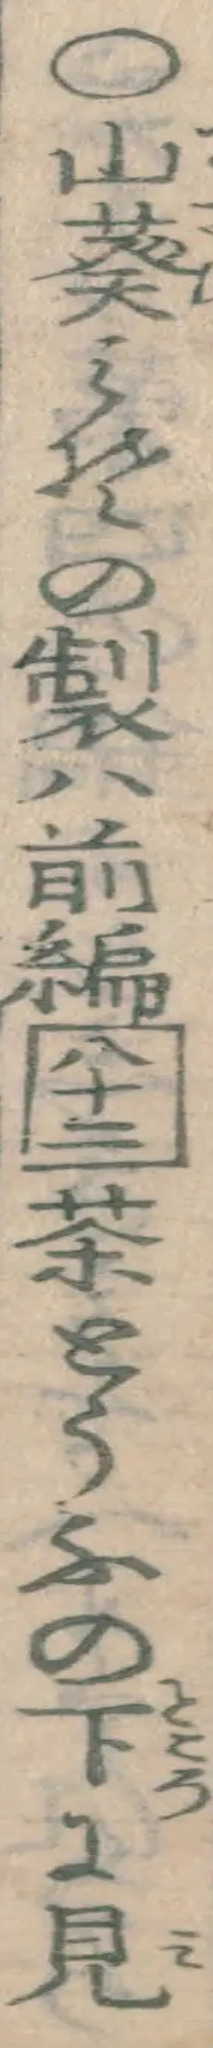○山葵みその製は前編八十二茶とうふの下に見
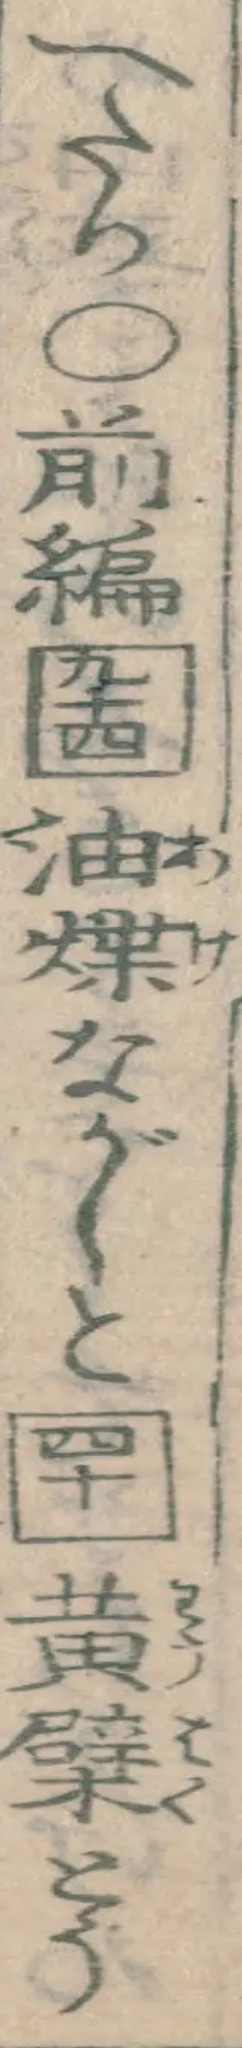へたり○前編九十四油煠ながしと四十黄檗とう
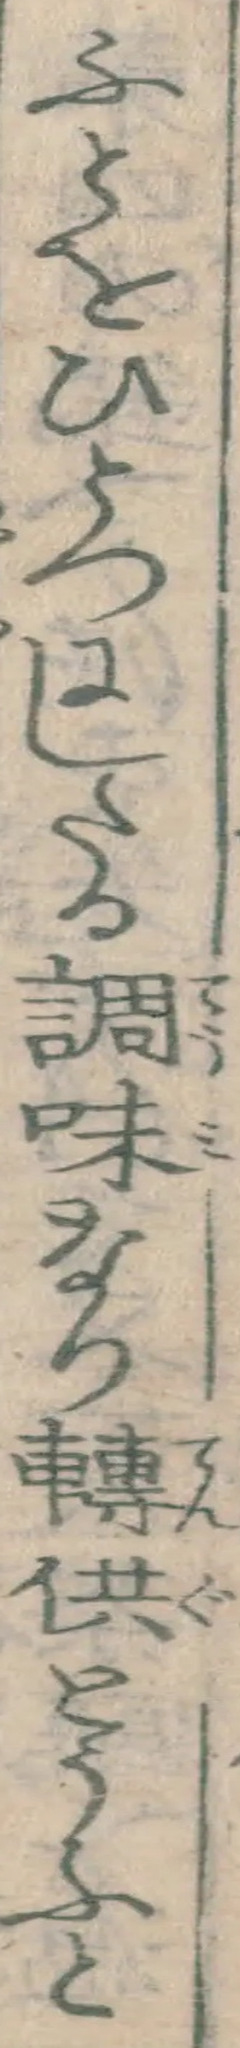ふとをひとつにしたる調味なり転供とうふと
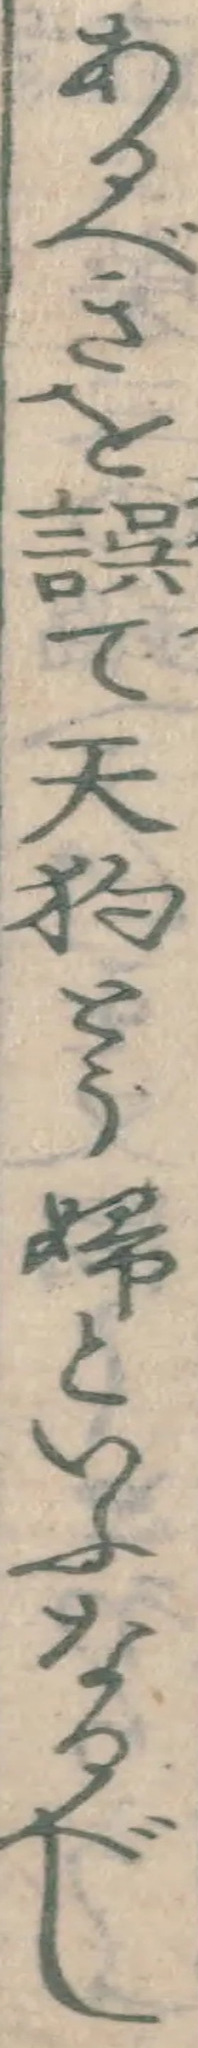あるべきを誤て天狗とうふといふなるべし
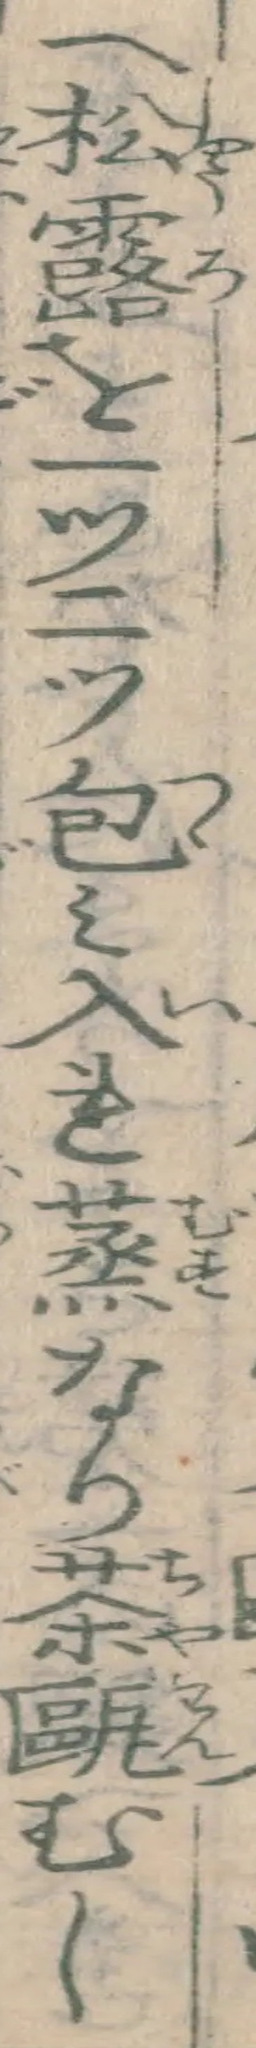へ松露を一つ二つ包み入れ蒸なり茶甌むし
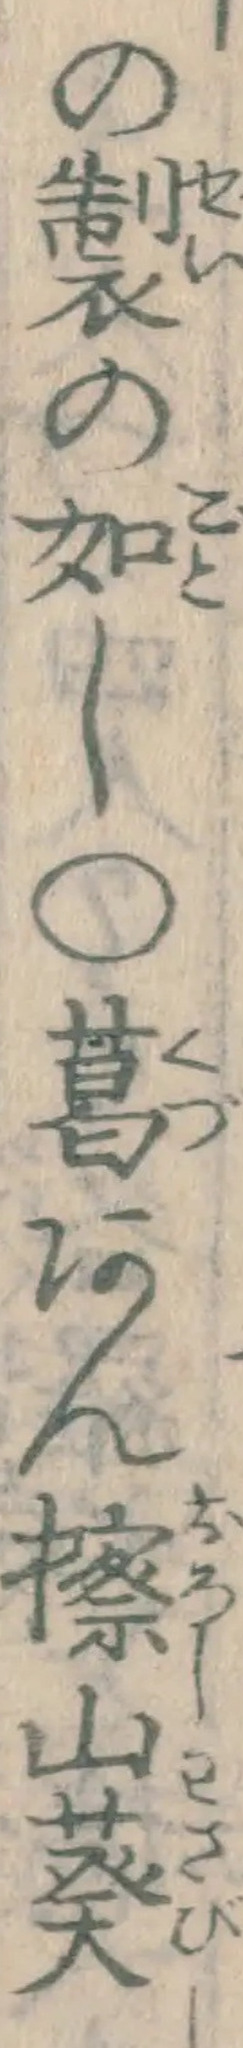の製の如し○葛あん擦山葵
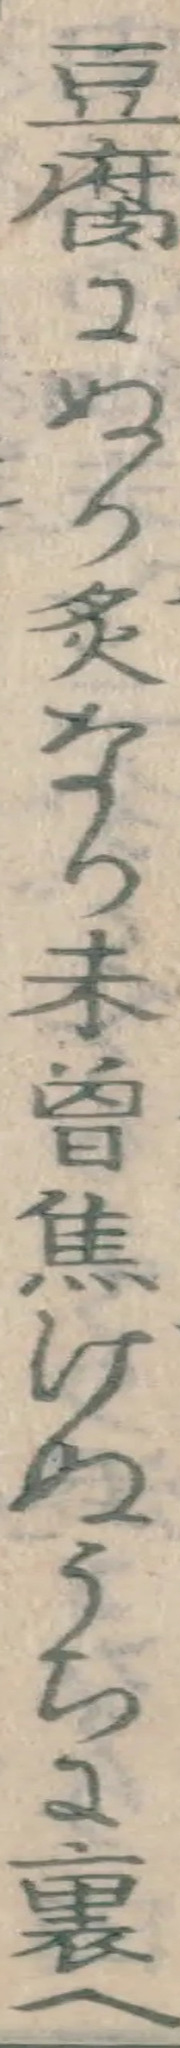豆腐にぬり炙なり未曽焦げぬうちに裏へ
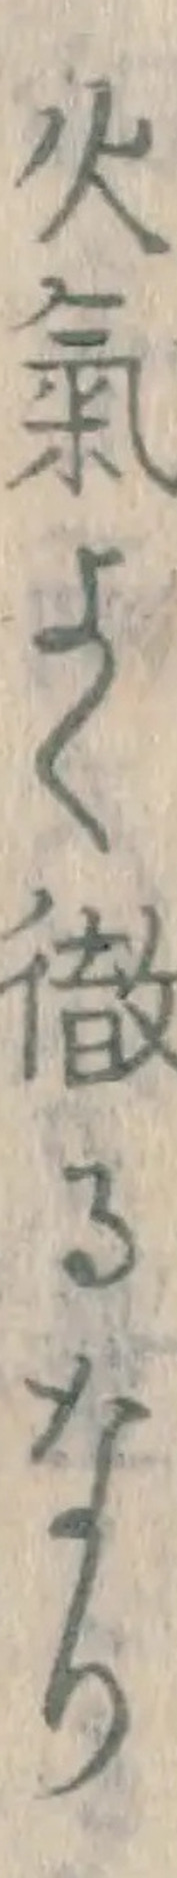火気よく徹るなり
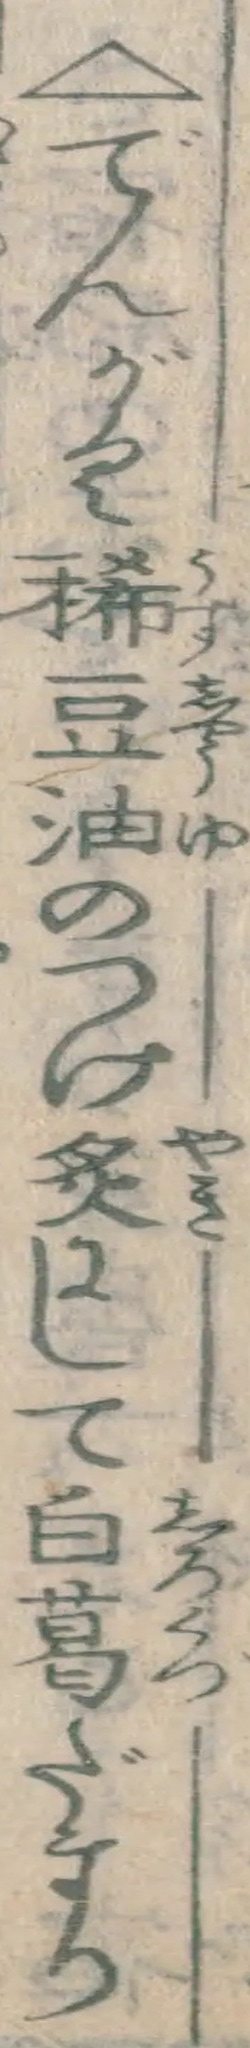△でんがく稀豆油のつけ炙にして白葛だまり
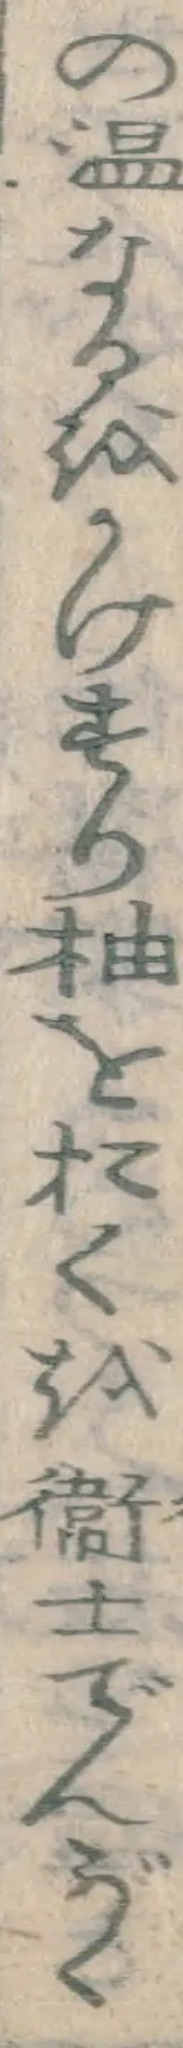の温なるをかけすり柚をおくを衛士でんがく
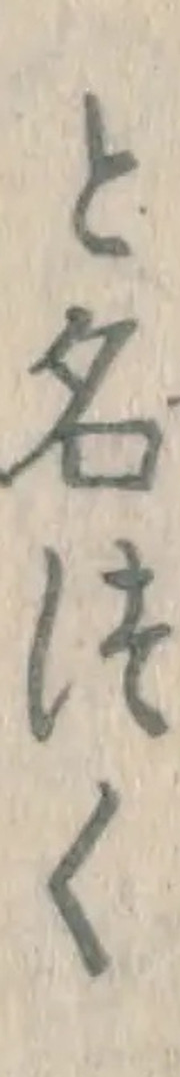と名づく
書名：豆腐百珍. 続編
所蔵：国立国会図書館 National Diet Library, JAPAN
